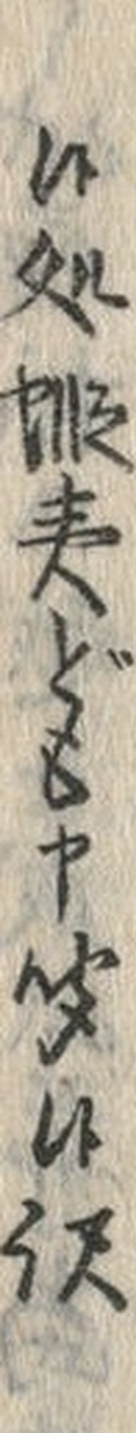候処蝦夷ども申聞候訳
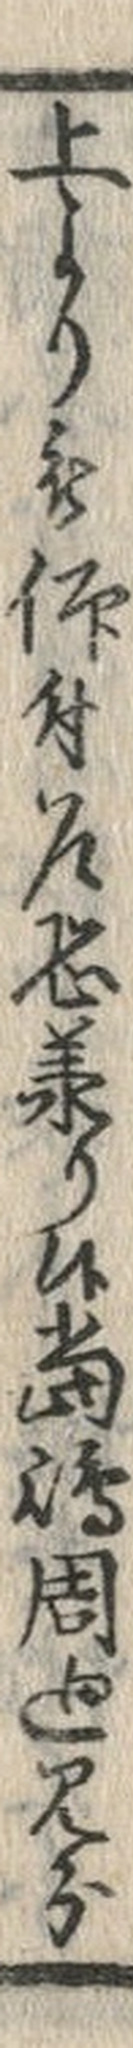上より被仰付乍恐承り候当嶋周廻見分
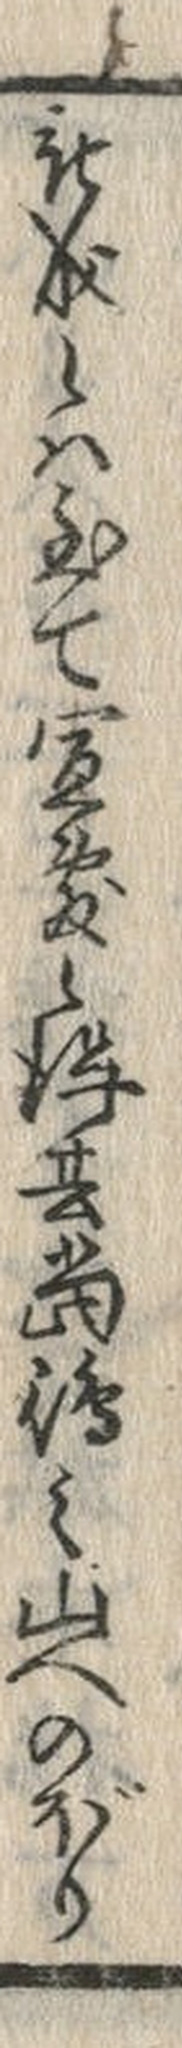被成候は至て宜敷候得共当嶋之山へのぼり
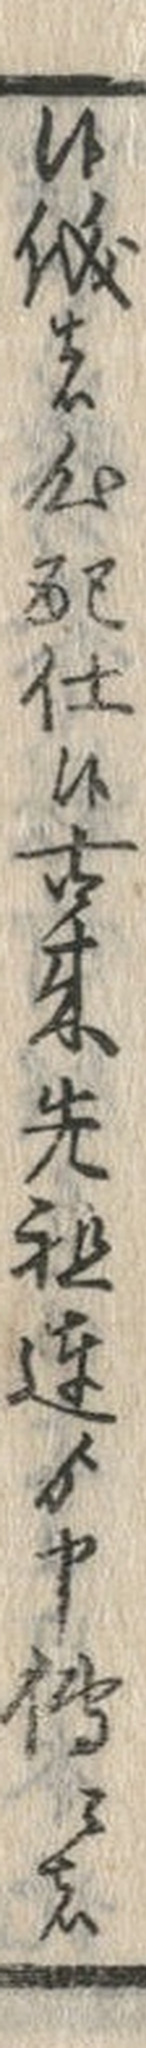候儀は心配仕候古来先祖達ゟ申伝には
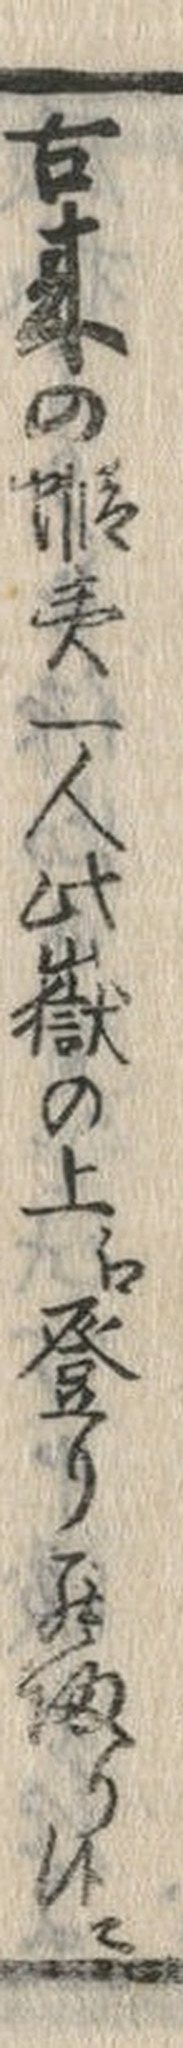古来の蝦夷一人此嶽の上え登り罷帰り候に

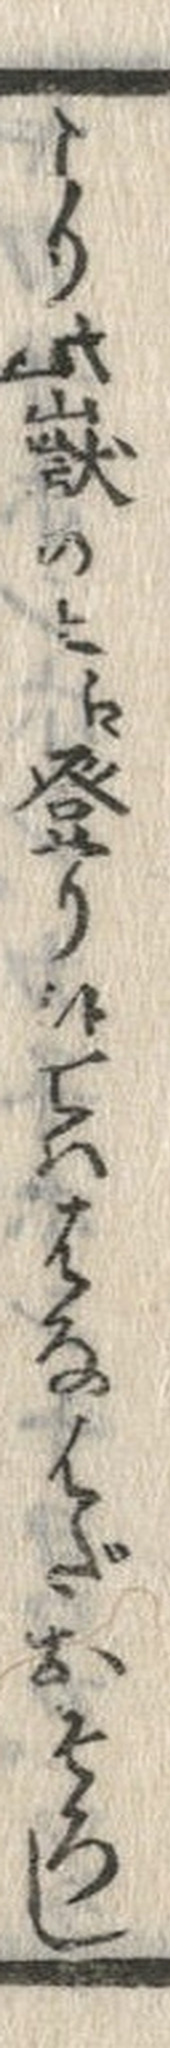より此嶽の上え登り候てハはなはだおそろし
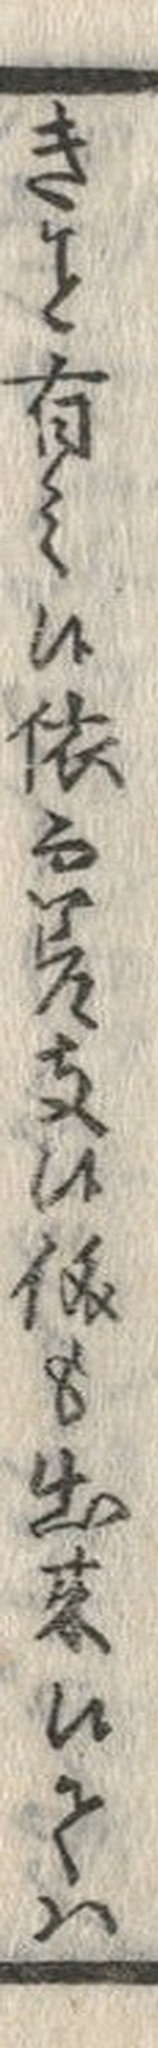きこと有之候依而差支候儀も出来候ては
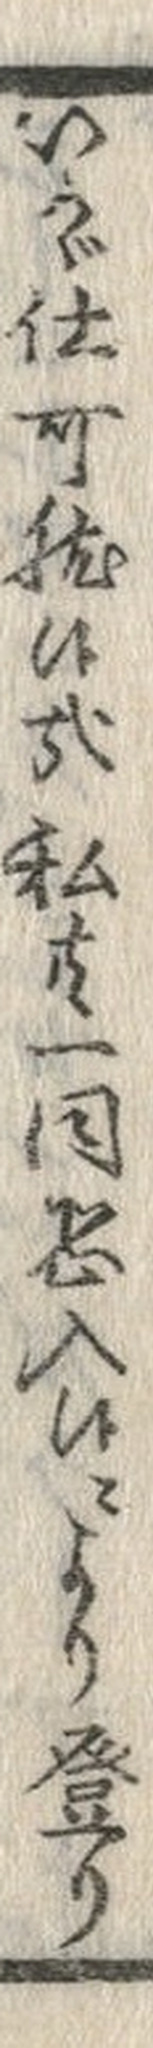いかゞ仕可然候哉私共一同恐入候により登り
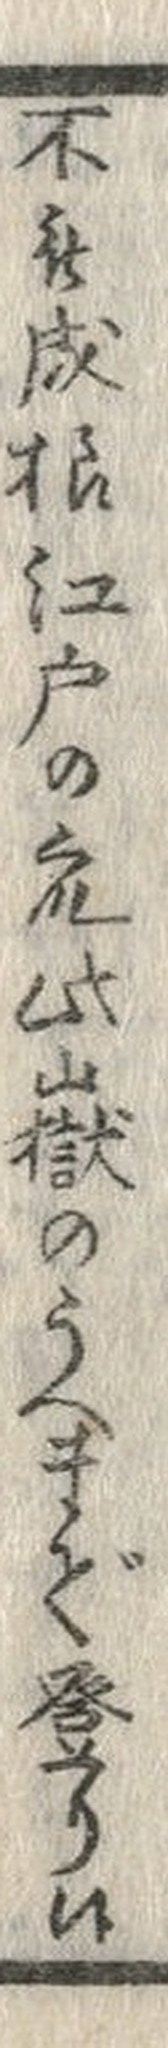不被成様江戸の衆此嶽のうへまで登り候
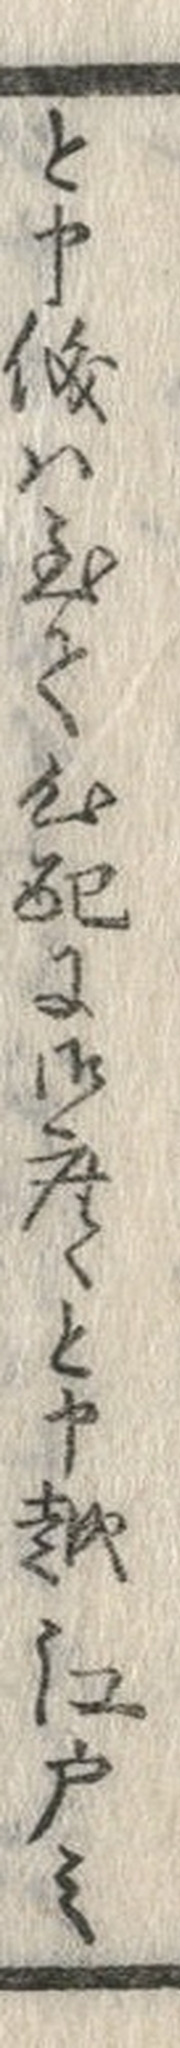と申儀は至て心配に御座候と申越江戸之
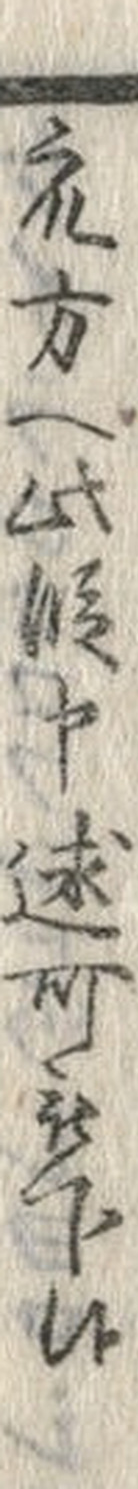衆方へ此段申述可被下候
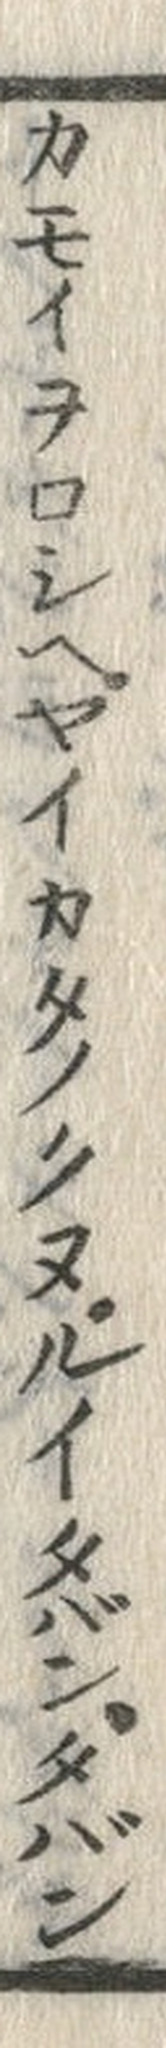カモイヲロシヘ。ヤイカタノクヌ。ルイタバン。タバン
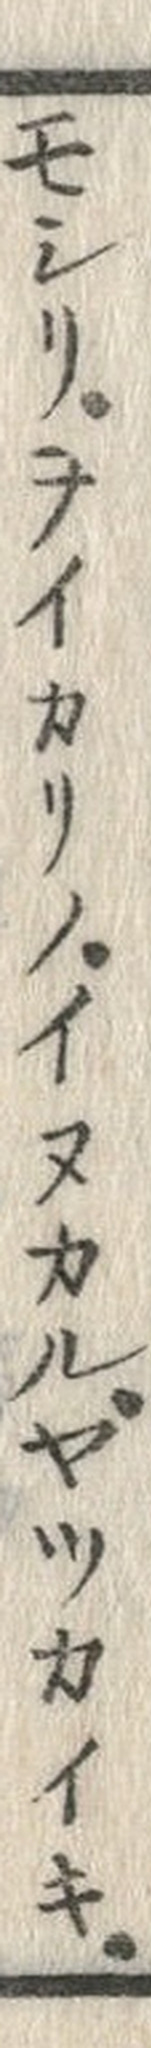モシリ。ヲイカリノ。イヌカル。ヤツカイキ。
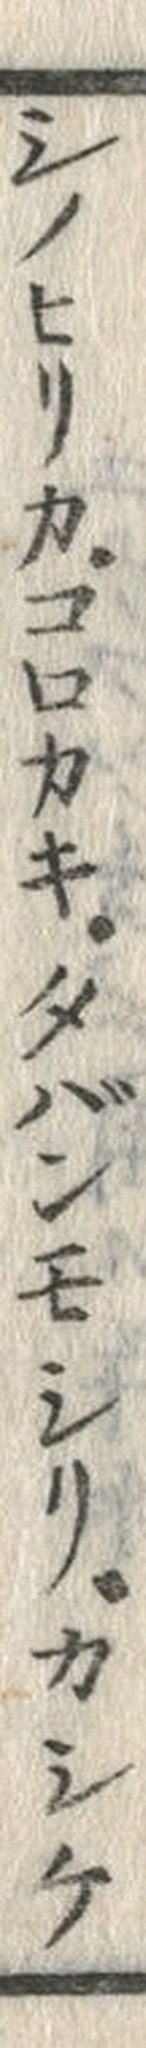シノヒリカ。コロカキ。タバンモシリ。カシケ
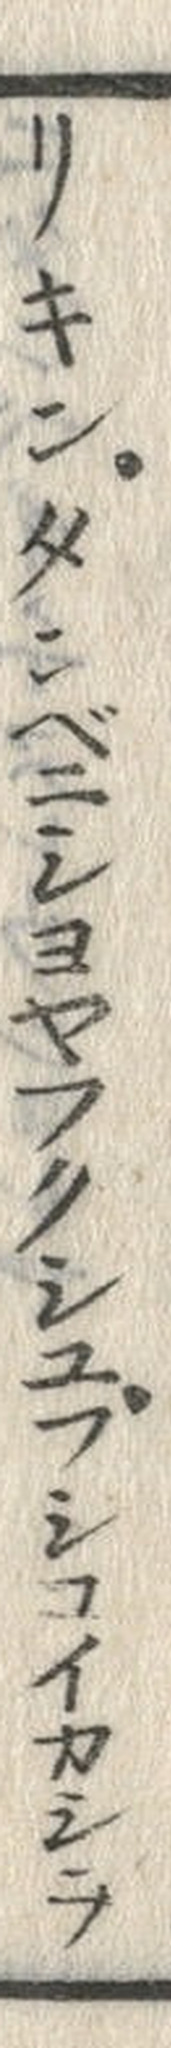リキン。タンベニシヨヤフクシユ。フシコイカシヲ
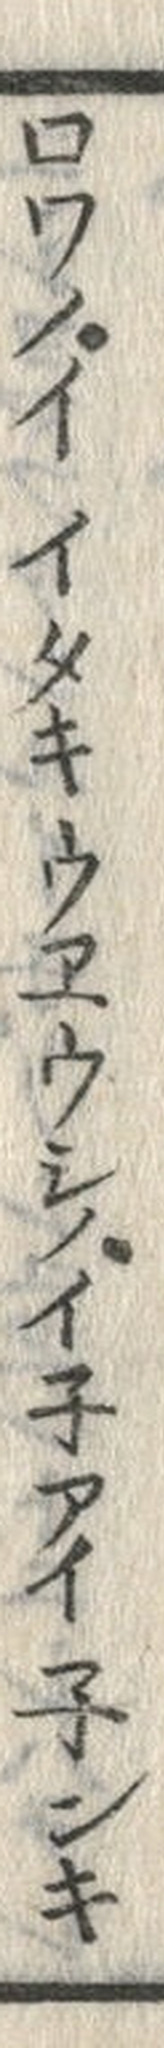ロワノ。イタキウヱウシノ、イネアイネンキ
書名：蝦夷方言藻汐草　坤巻
